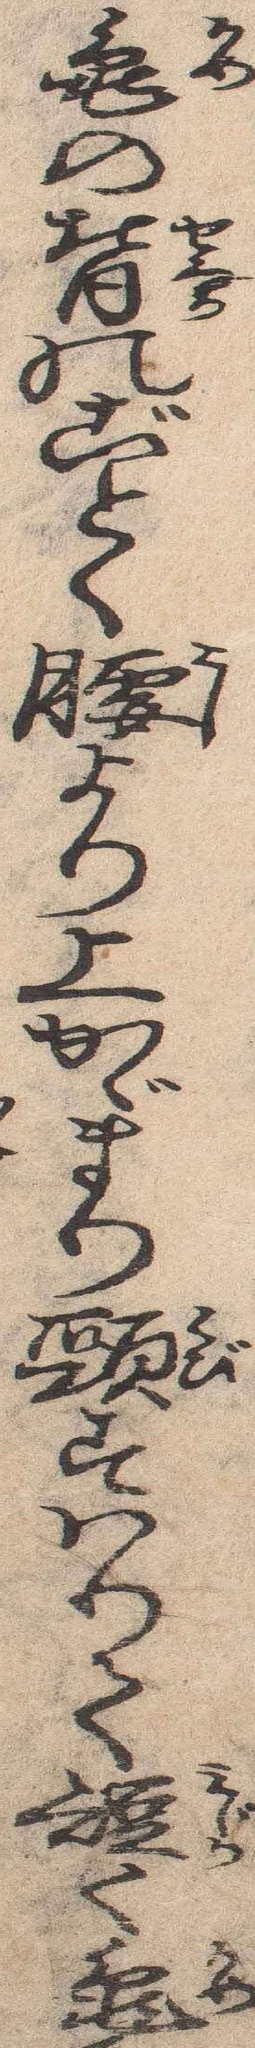亀の背のごとく腰より上かゞまり頸すはりて短く亀
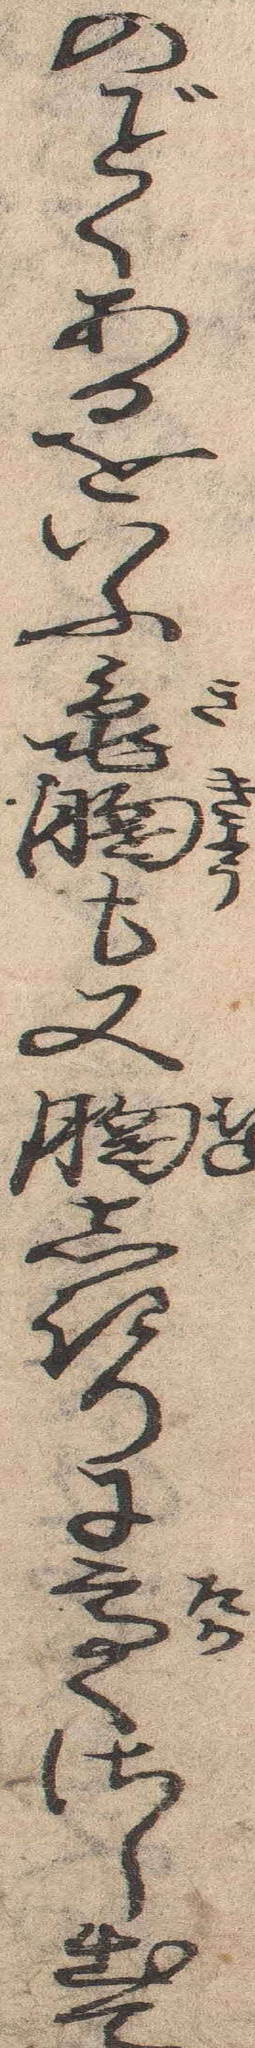のごとくあるをいふ亀胸も又胸しきりに高くさし出て

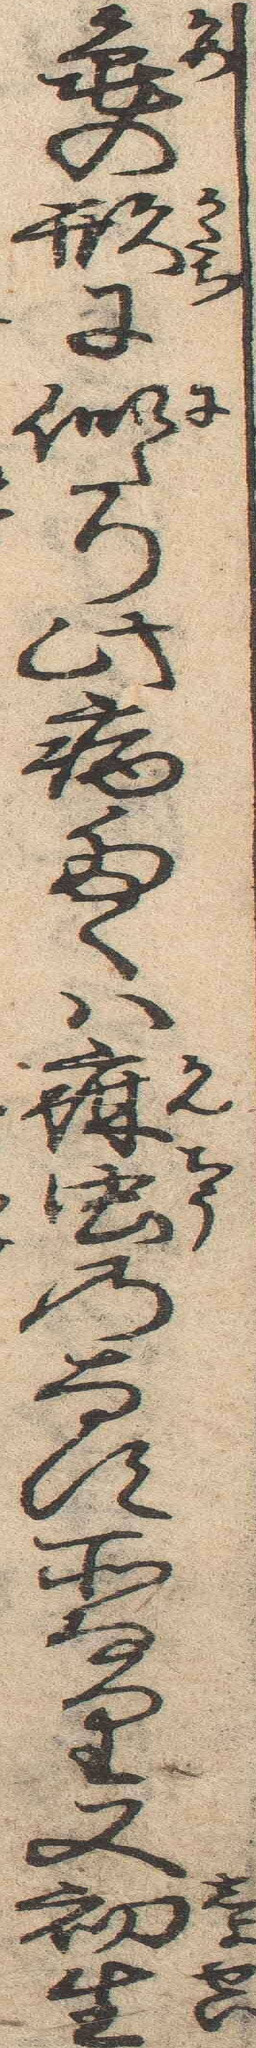亀の形に似たり此病多くは疳虫のなす所なり又初生
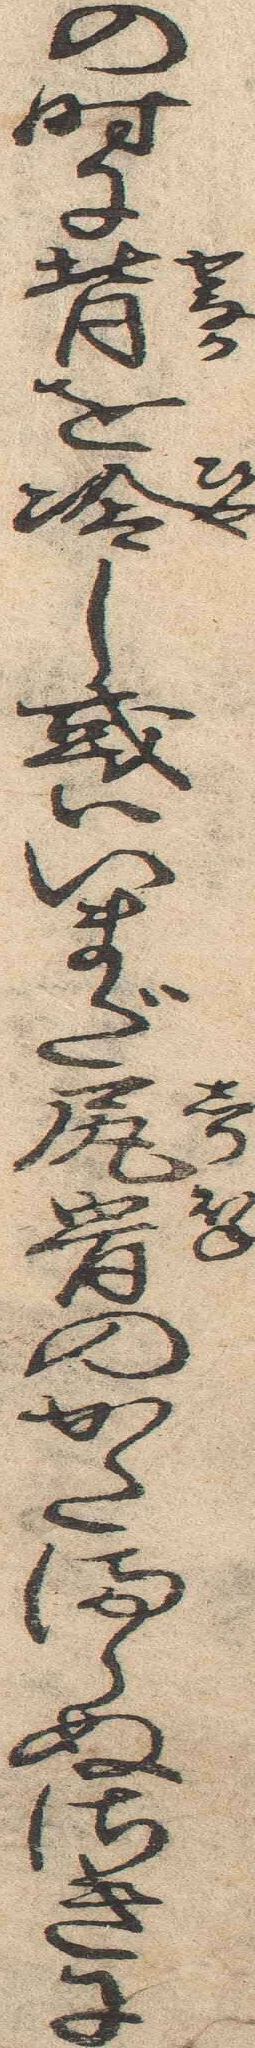の時に背を冷し或はいまだ尻骨のかたまらぬさきに
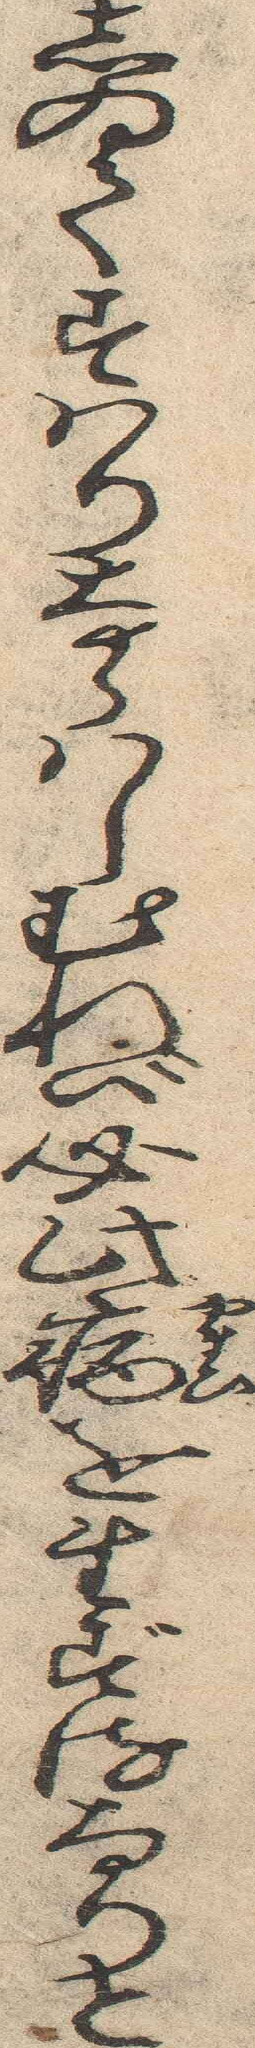しゐてすはりならはしむれば必此病を生ずるなりと
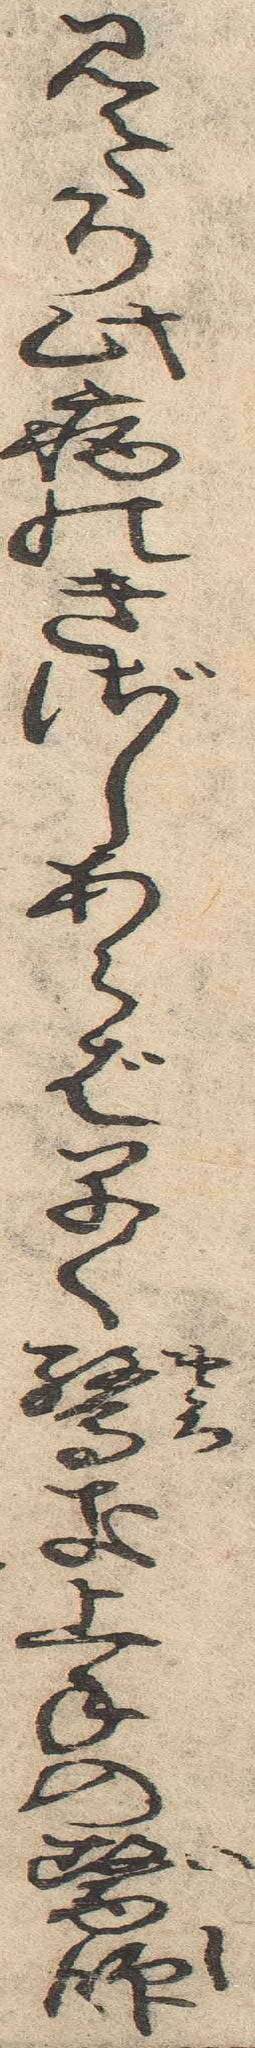見えたり此病のきざしあらば早く驚き上手の医師
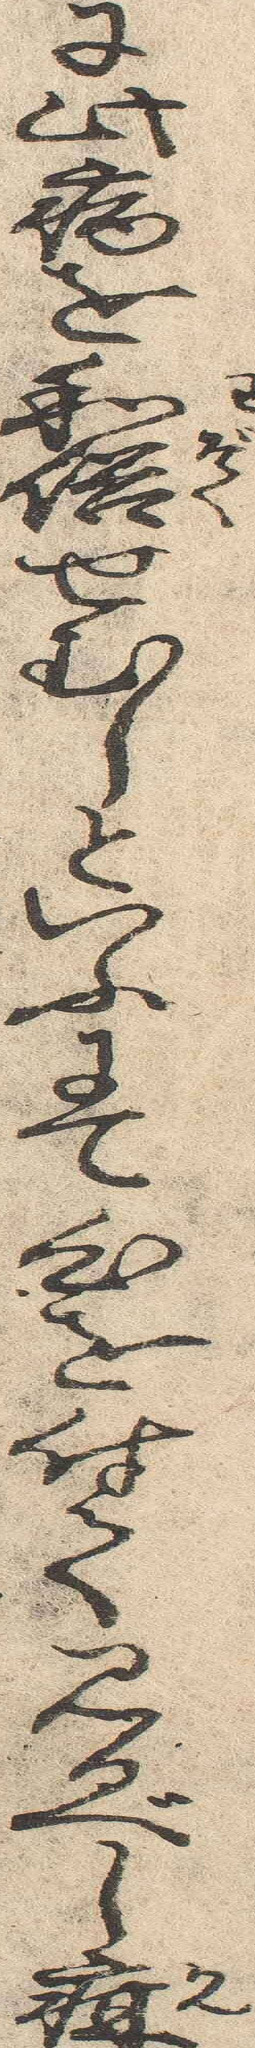に此病を和俗せむしといふにて心を付てみるべし疳
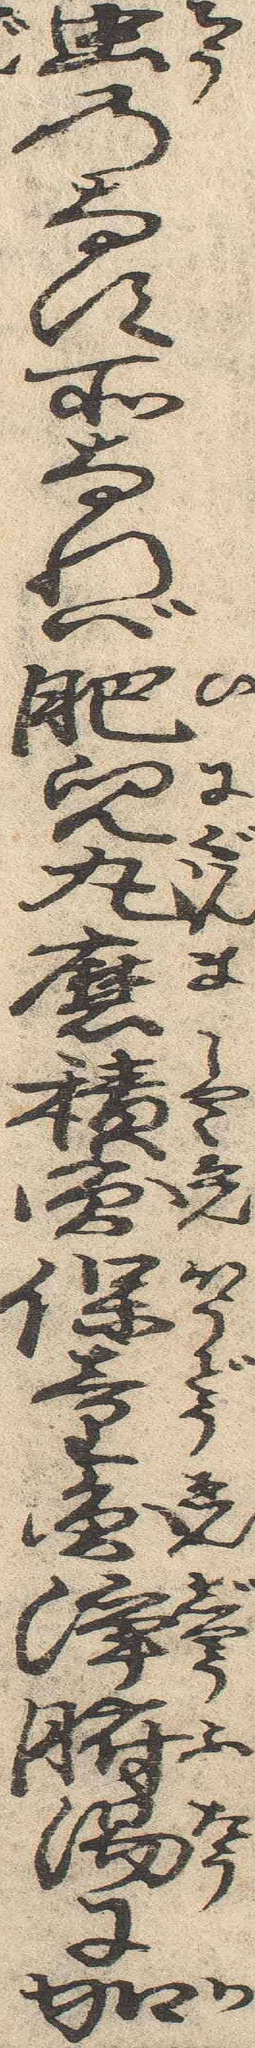虫のなす所なれば肥児丸磨積円保童円浄腑湯に加
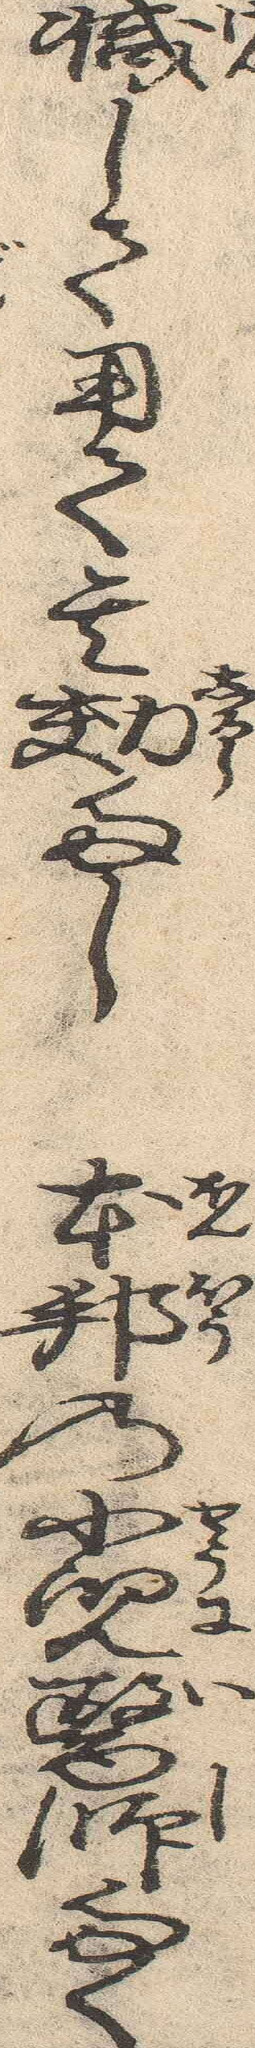減して用て其効多し本邦の小児医師多く
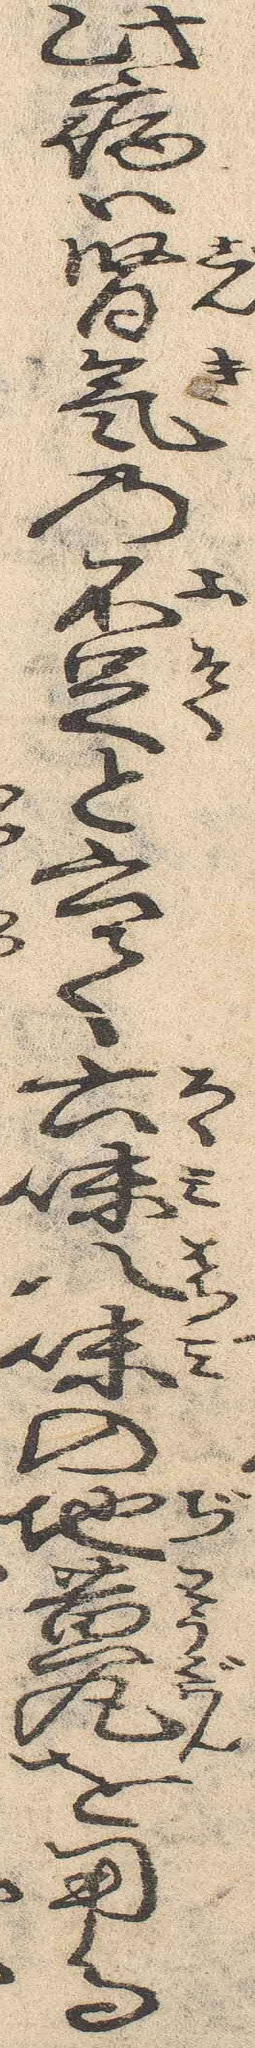此病は腎気の不足と云て六味八味の地黄丸を用る
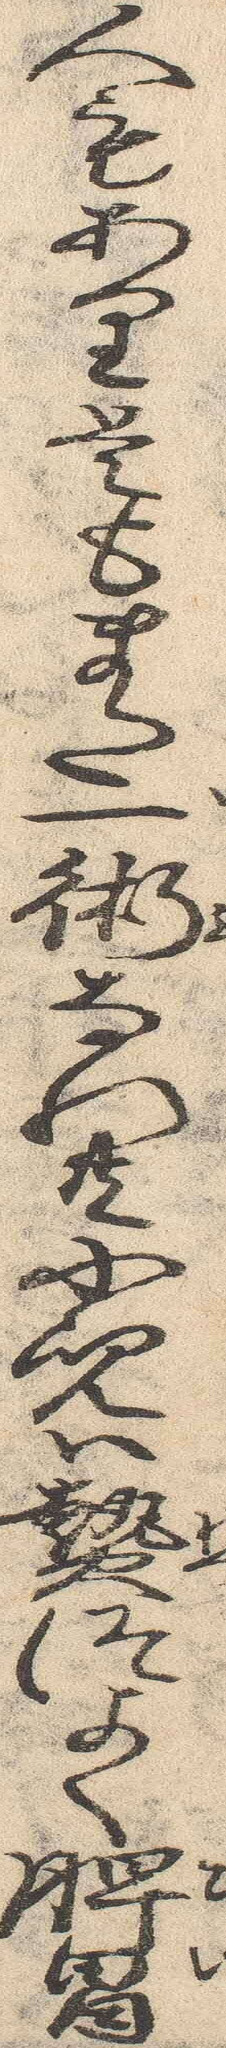人もあり是もまた一術なれ共小児は熱つよく脾胃
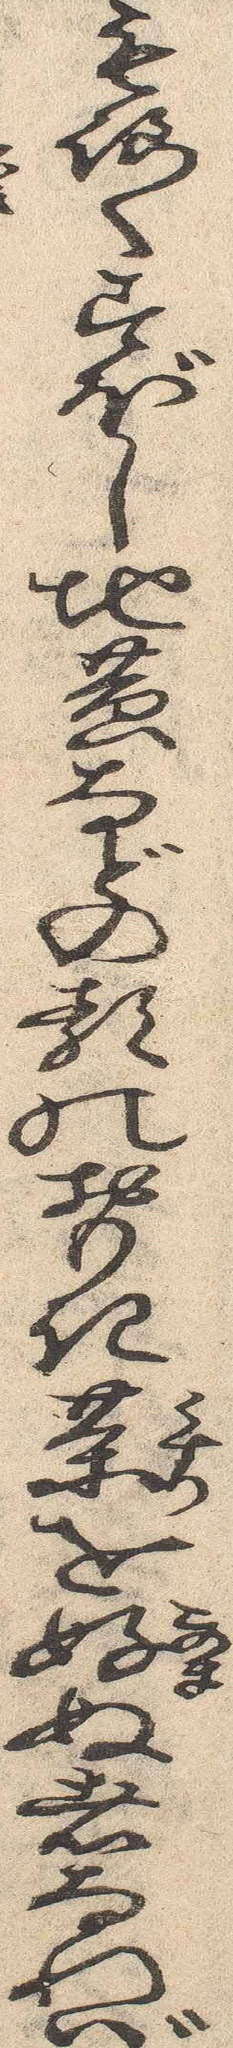もろくすぼし地黄などの類のおもき薬を好ぬ者なれば
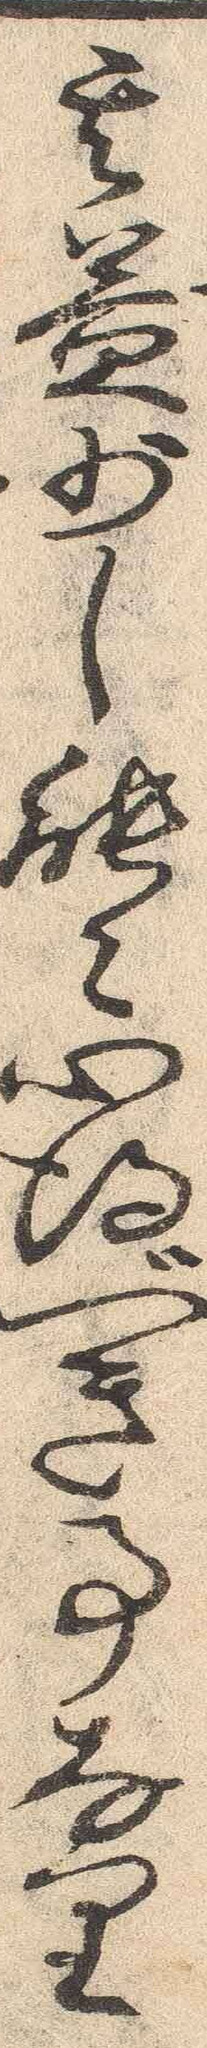其益少し能々心得べき事なり
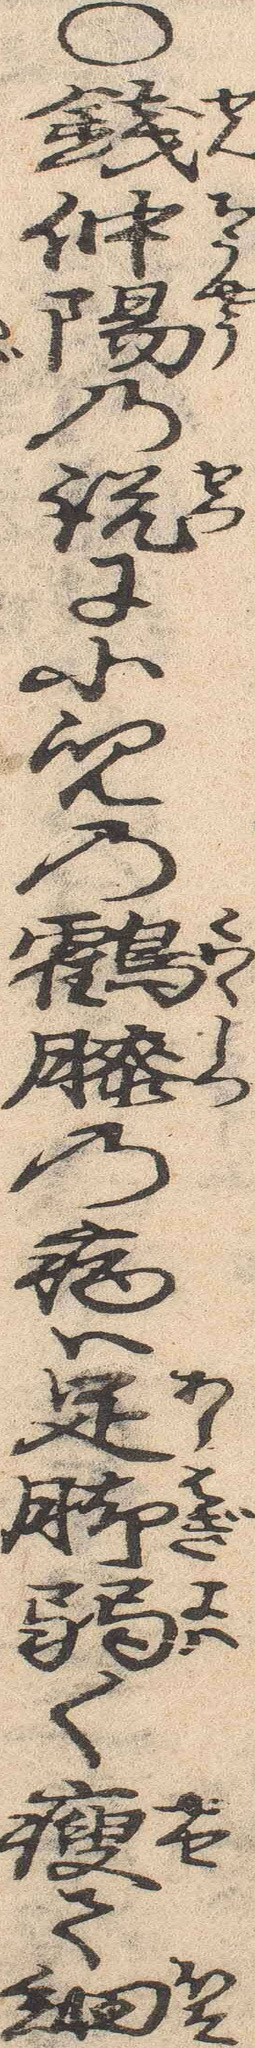○銭仲陽の説に小児の鶴膝の病は足脚弱く痩て細
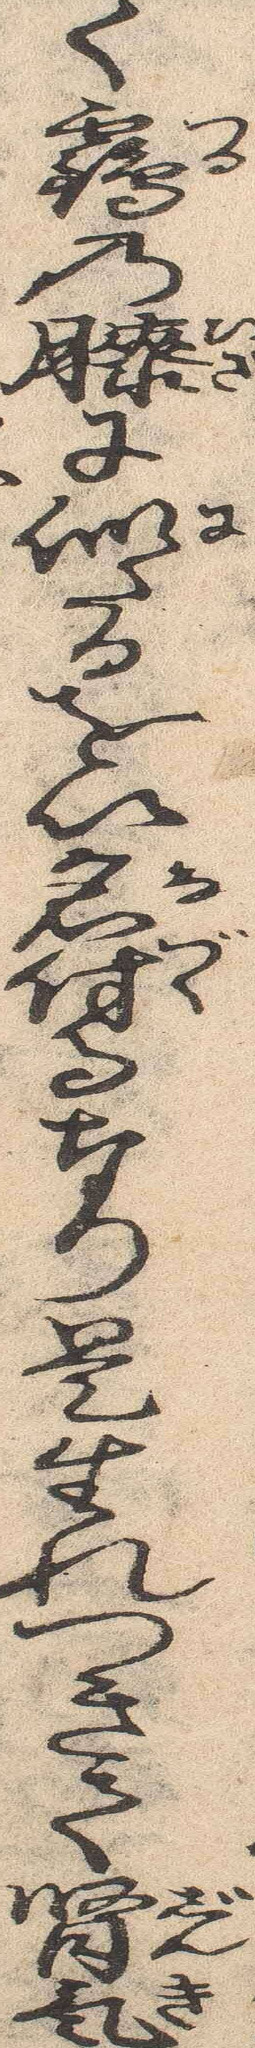く鶴の膝に似たるを以名付るなり是生れつきて腎気
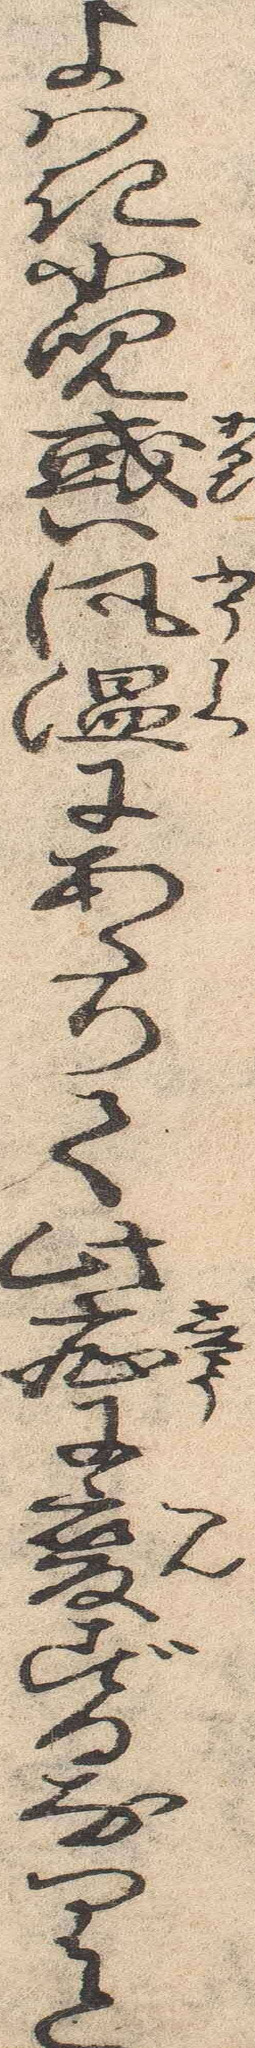よわき小児或は風湿にあたりて此症に変ずるなりと
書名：小児必用養育草
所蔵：東京学芸大学附属図書館 国文学研究資料館
